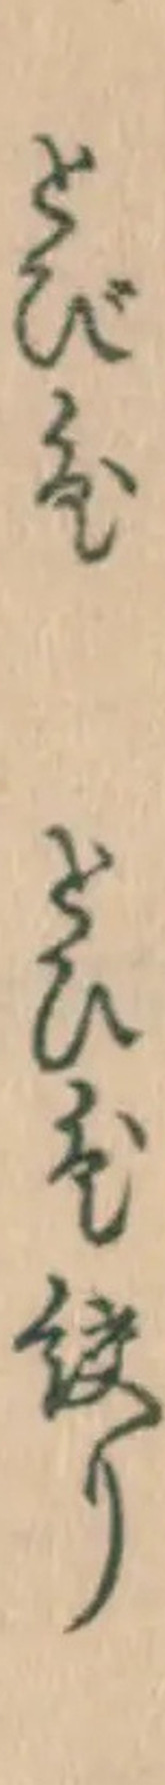とび色とひ色絞り
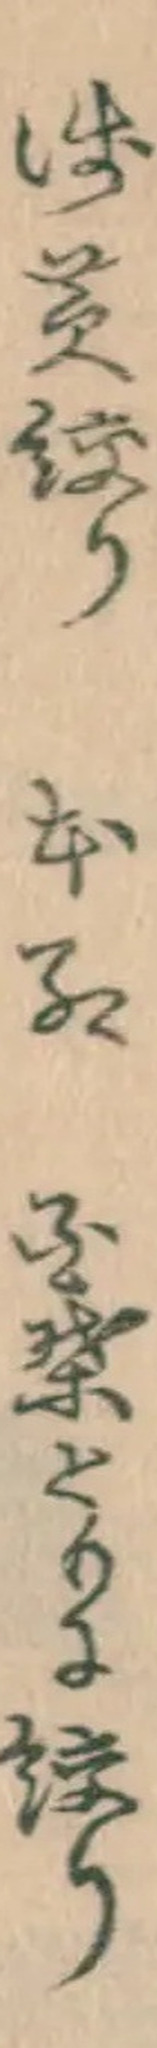浅黄絞り本紅白紫ともに絞り
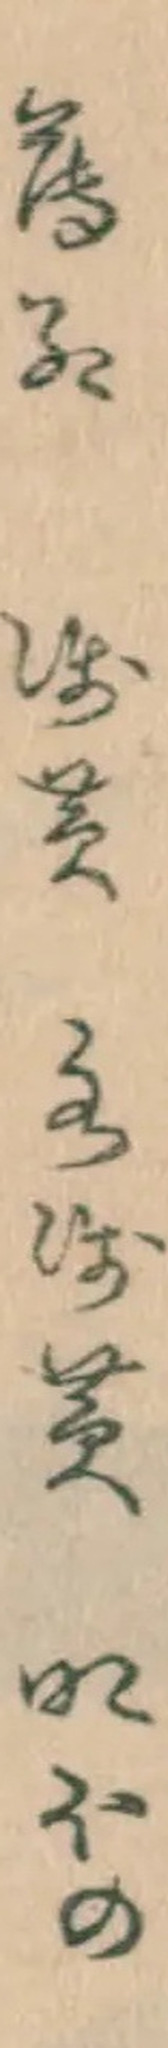薄紅浅黄水浅黄明ほの
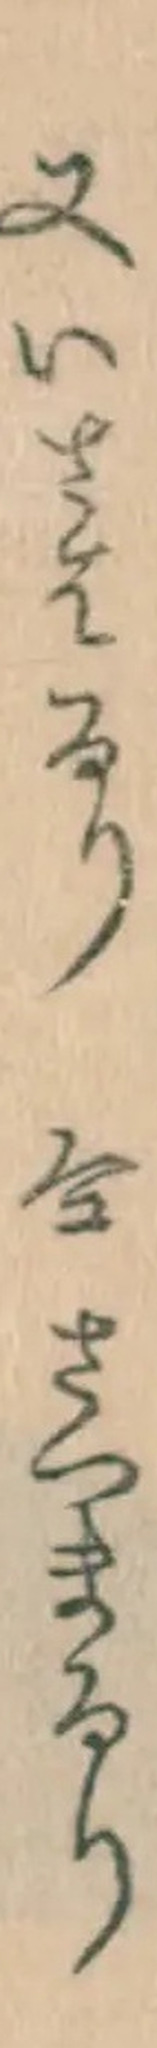又いさはるり仝さつまるり
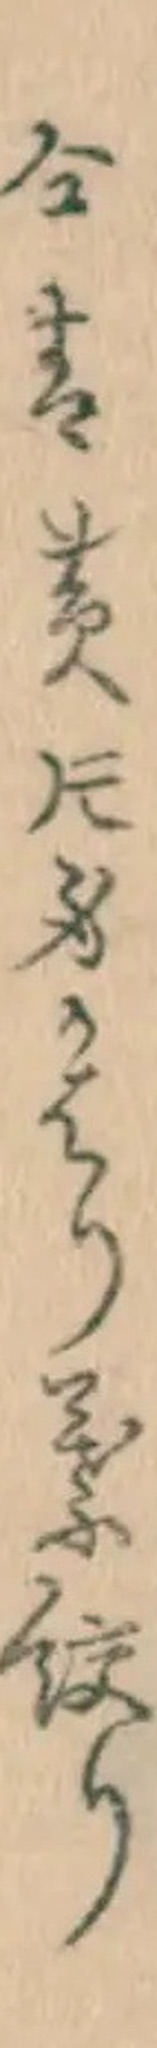仝青黄片身かはり葉絞り
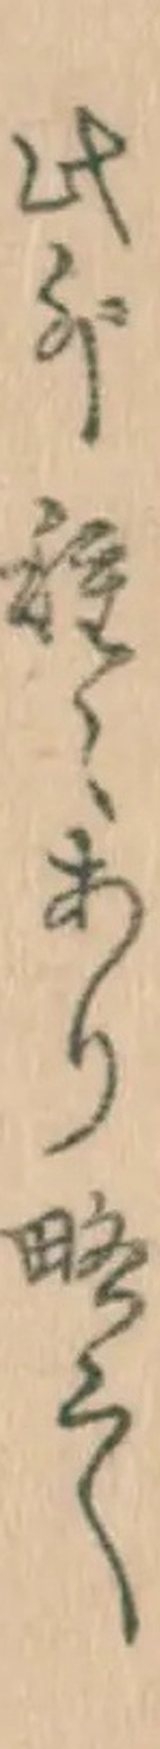此外種々あり略之
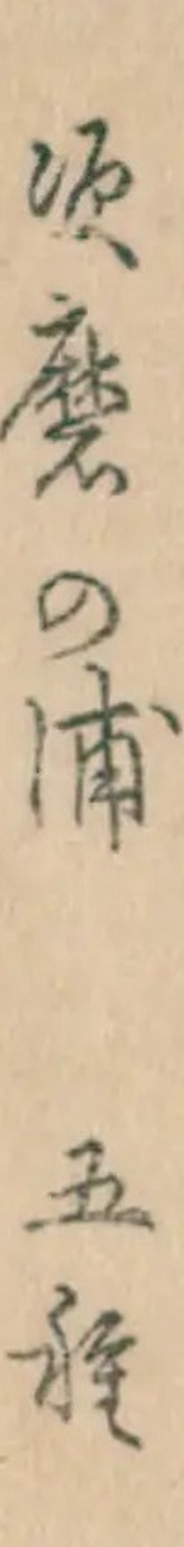須磨の浦五種
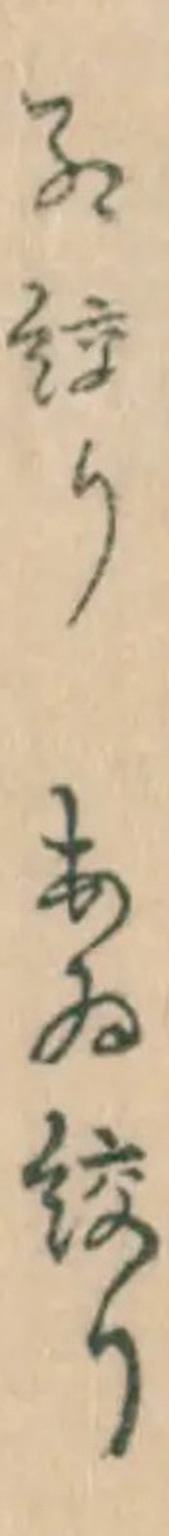紅絞りあゐ絞り

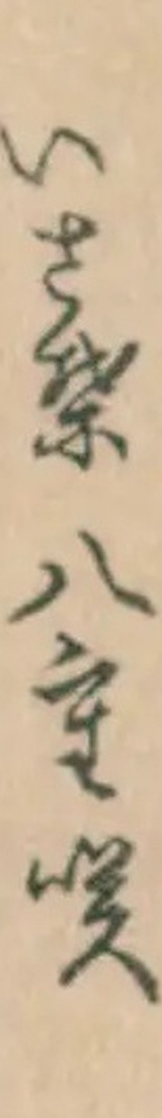いさ葉八重咲
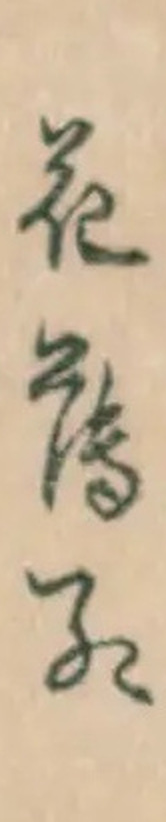花薄紅
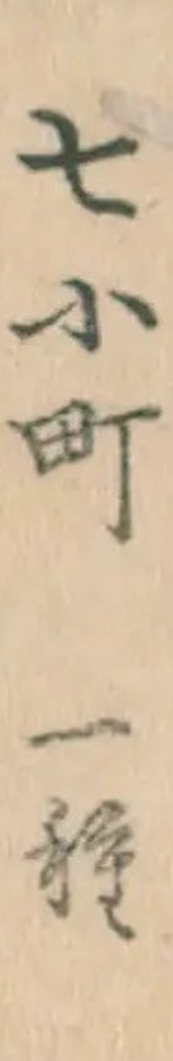七小町一種
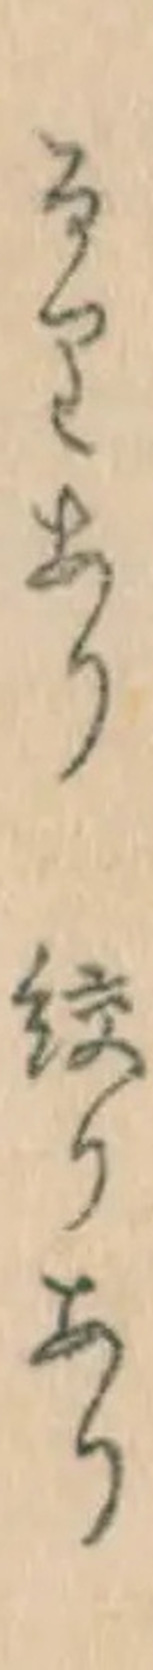るりあり絞りあり
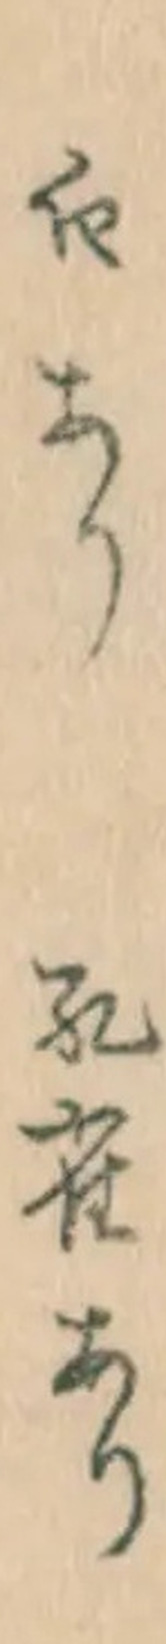白あり孔雀あり
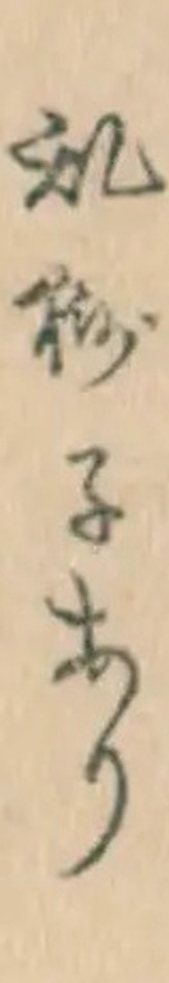乱獅子あり

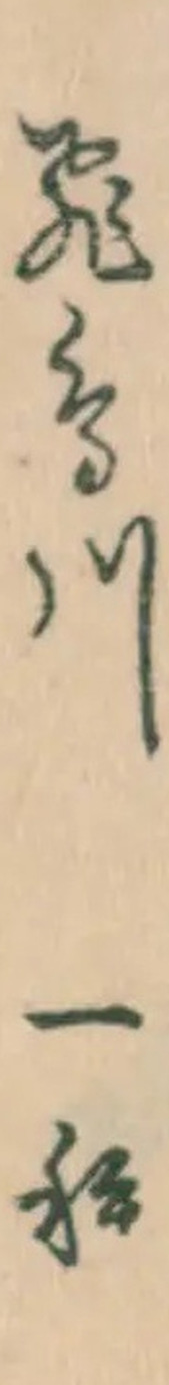飛鳥川一種
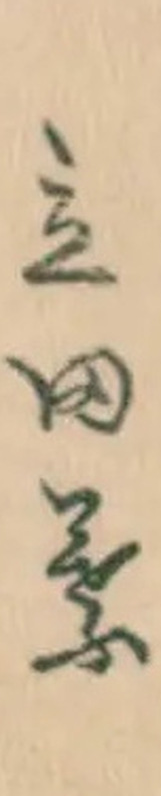立田葉
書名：朝顔叢. 上巻
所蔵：国立国会図書館 National Diet Library, JAPAN
